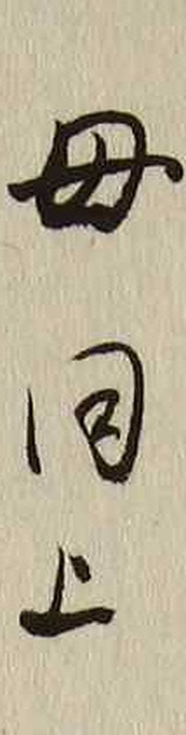母同上
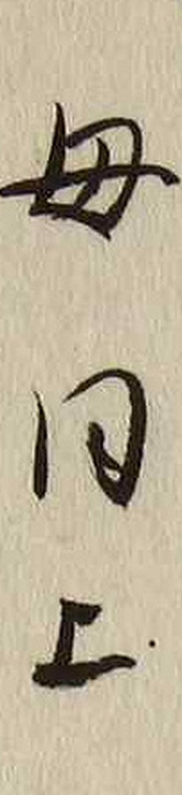母同上
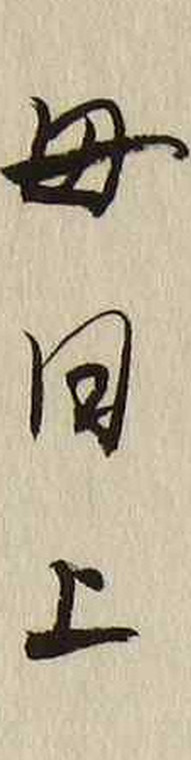母同上
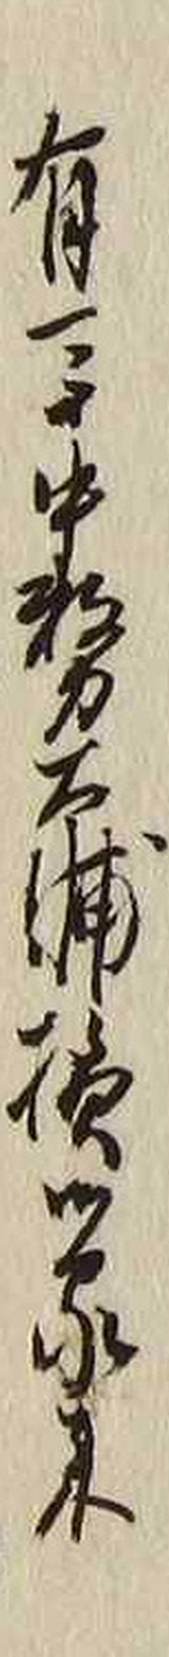有馬中務大輔様御家来
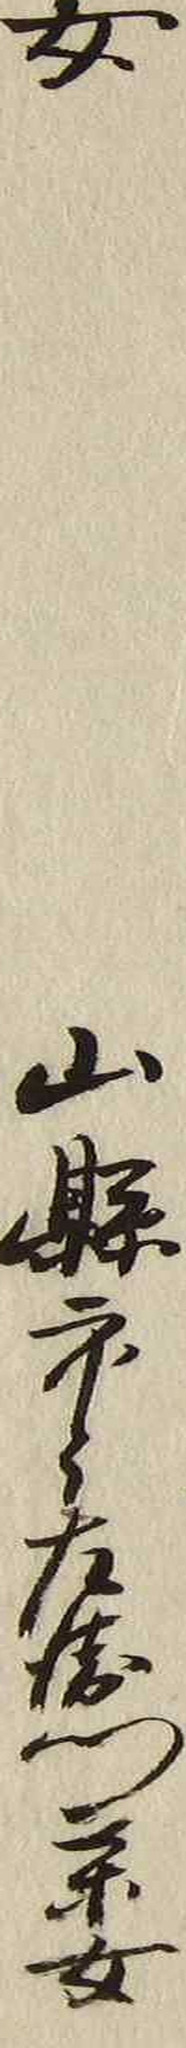女山県市郎左衛門某女
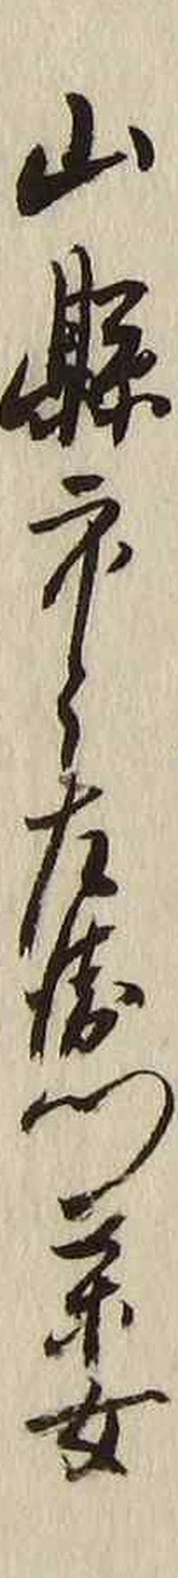女山県市郎左衛門某女
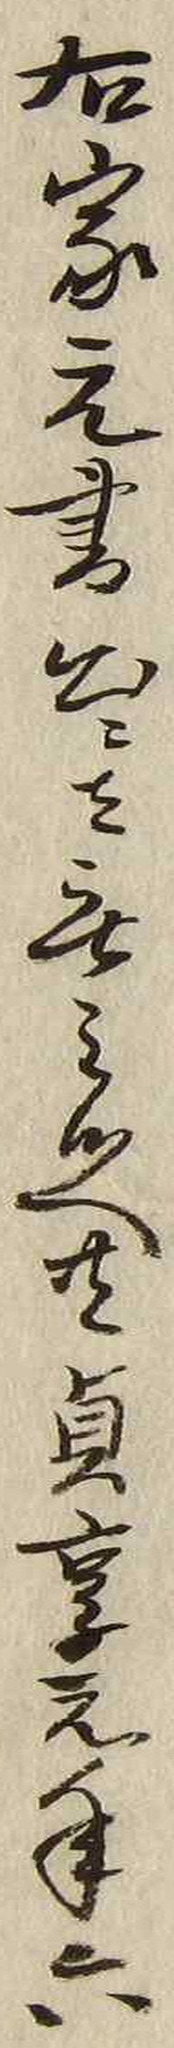右家元書出ニ者無之候へ共貞享元年六

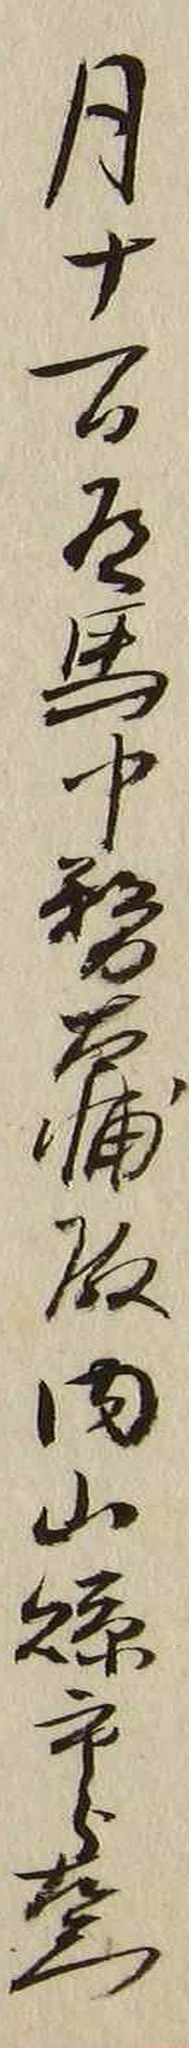月十一日有馬中務太輔殿内山県市郎左衛門
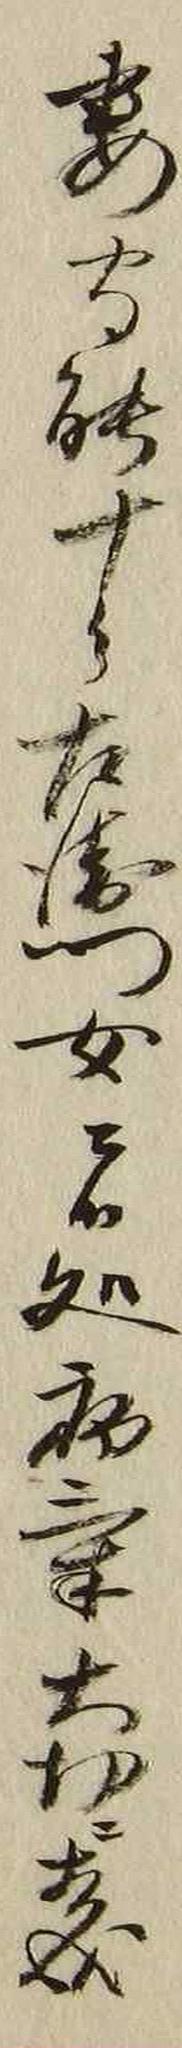妻守能十郎左衛門女ニ候処病気大切ニ相成
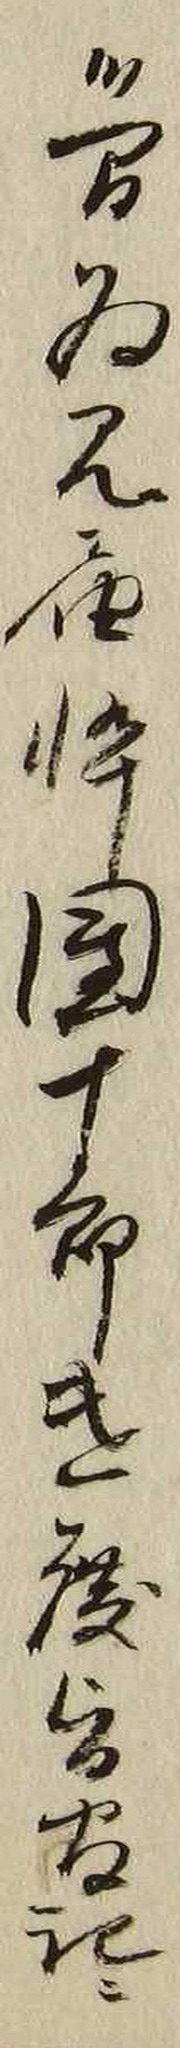候間為見届忰団十郎遣度旨官記ニ
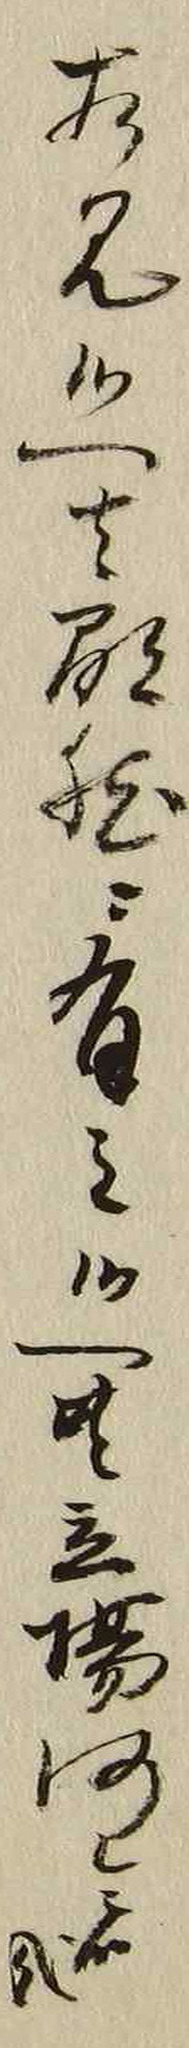相見候へ者顕然ニ有之候へ共立場何レニ候哉
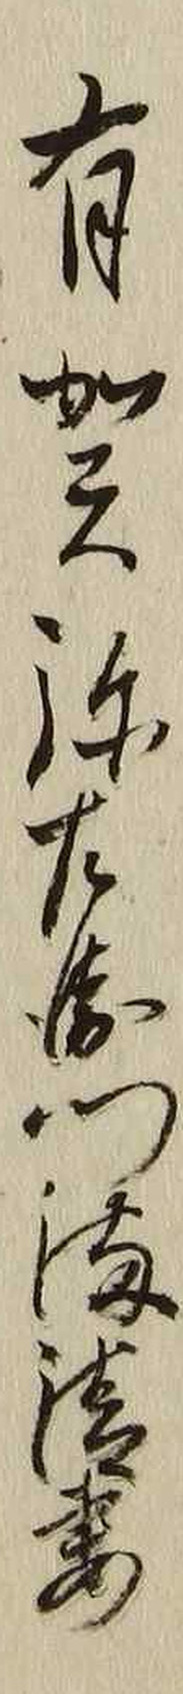女有賀弥左衛門満清妻
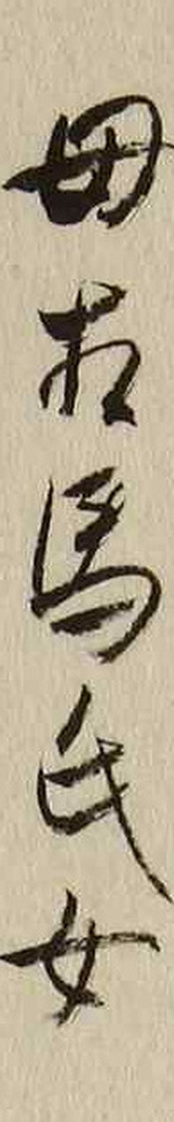母相馬氏女
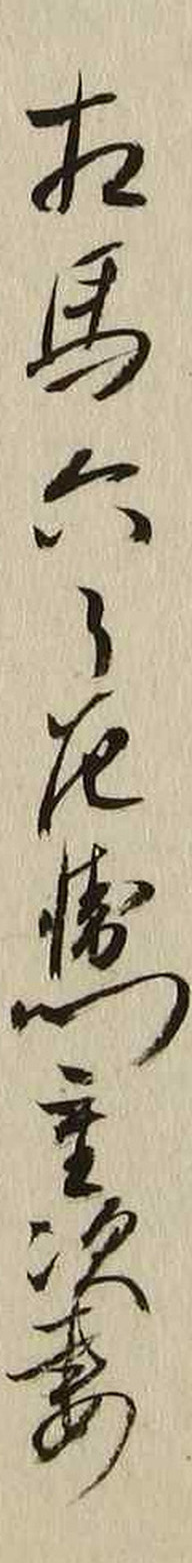女相馬六郎左衛門重次妻
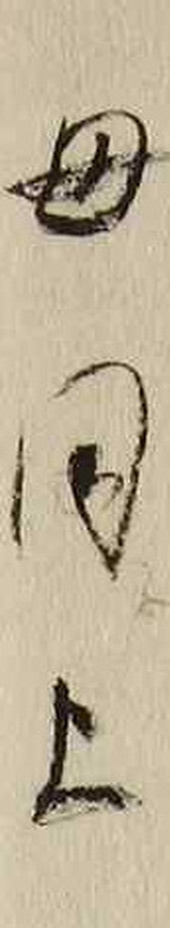母同上
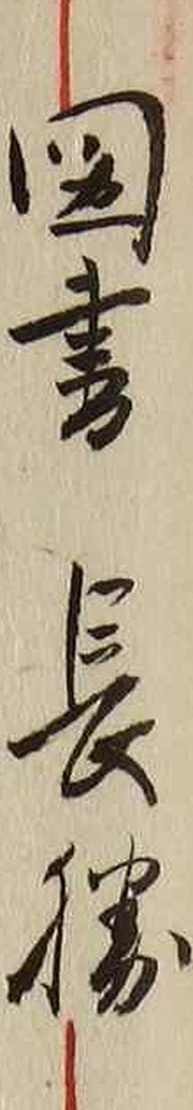図書長勝
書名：諸士系譜　巻之345　も之部1
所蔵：会津若松市立会津図書館
